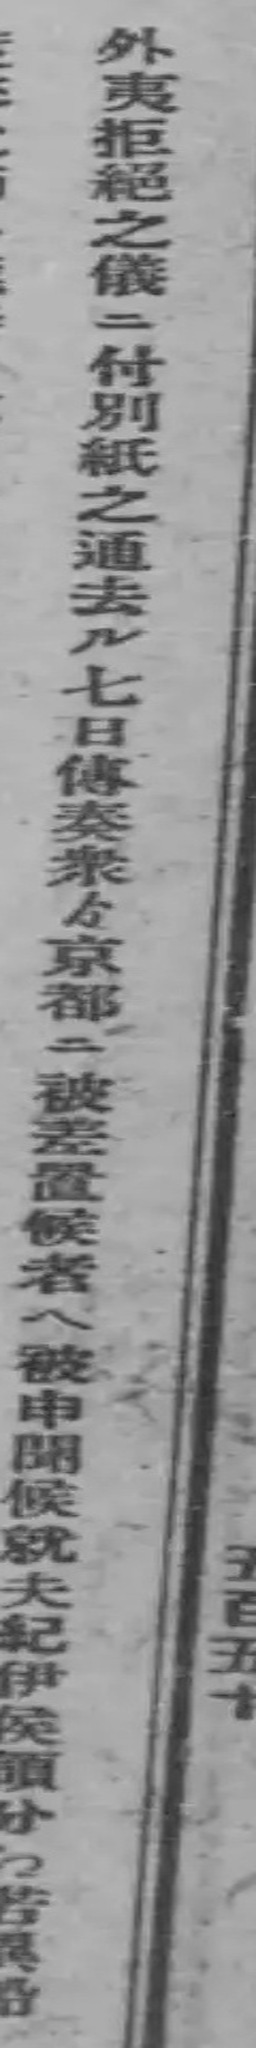外夷拒絶之儀ニ付別紙之通去ル七日伝奏衆ゟ京都ニ被差置候者へ被申聞候就夫紀伊侯領分え若異国
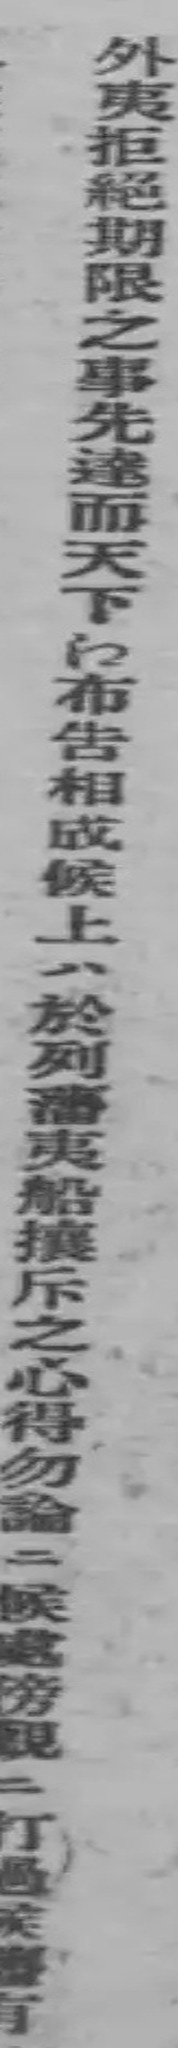外夷拒絶期限之事先達而天下え布告相成候上ハ於列藩夷船攘斥之心得勿論ニ候処傍観ニ打過候藩有
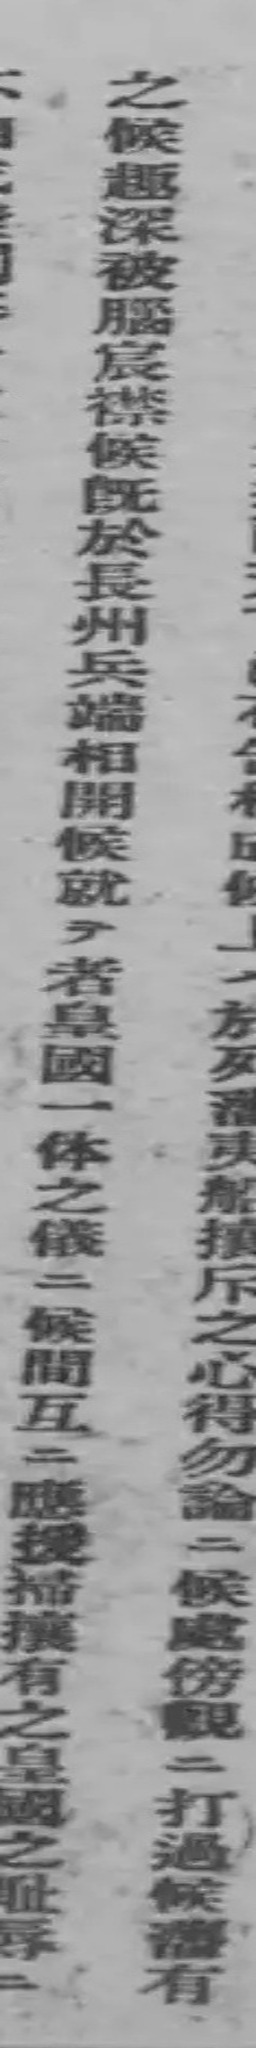之候趣深被脳宸襟候既於長州兵端相開候就テ者皇国一体之儀ニ候間互ニ応援掃攘有之皇国之耻辱ニ
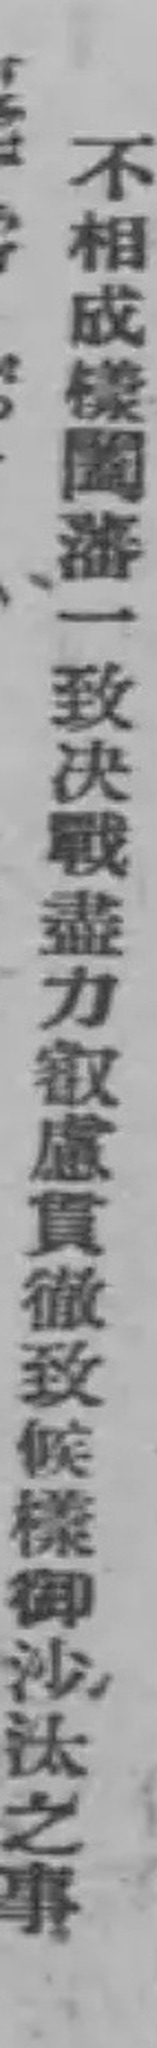不相成様闔藩一致決戦尽力叡慮貫徹致候御沙汰之事
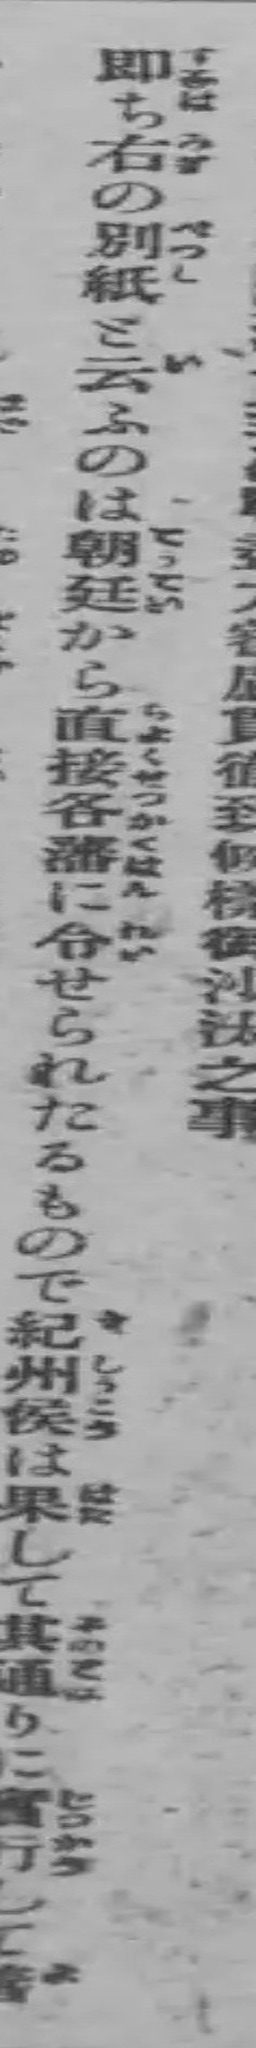即ち右の別紙と云ふのは朝廷から直接各藩に命ぜられたるもので紀州侯は果して其通りに実行して善
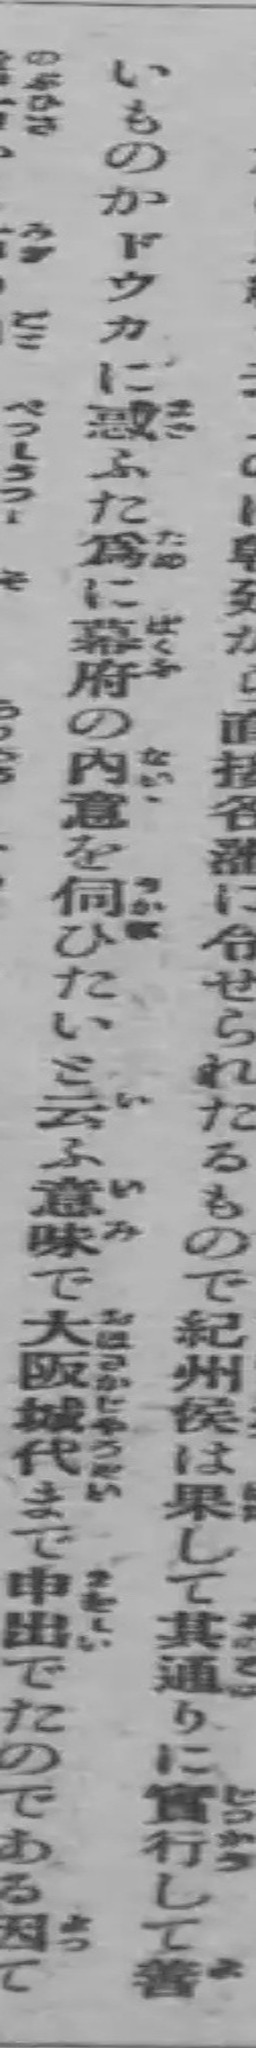いものかドウカに惑ふた為に幕府の内意を伺ひたいと云ふ意味で大阪城代まで申出でたのである因て
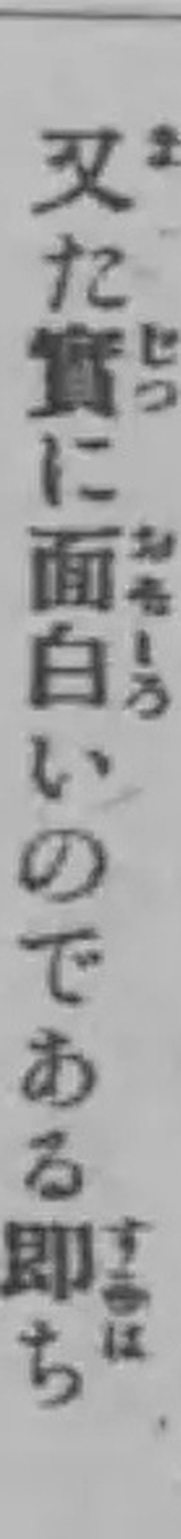又た実に面白いのである即ち
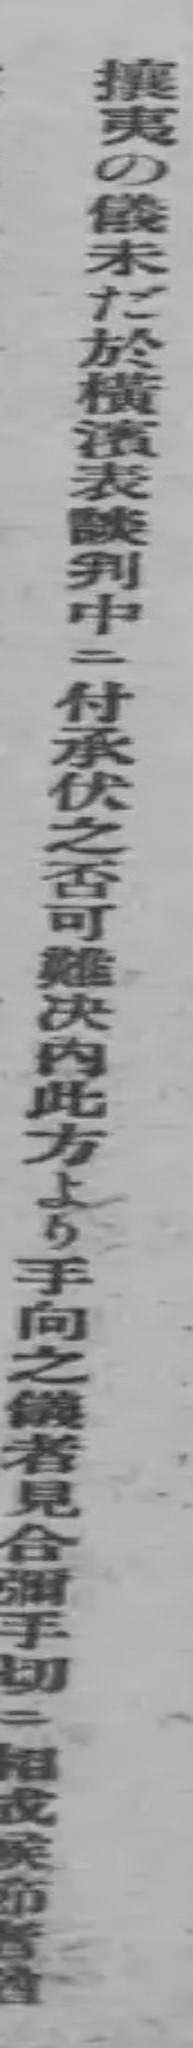攘夷の儀未だ於横浜表談判中ニ付承伏之否可難決内此方より手向之儀者見合弥手切ニ相成候節者猶
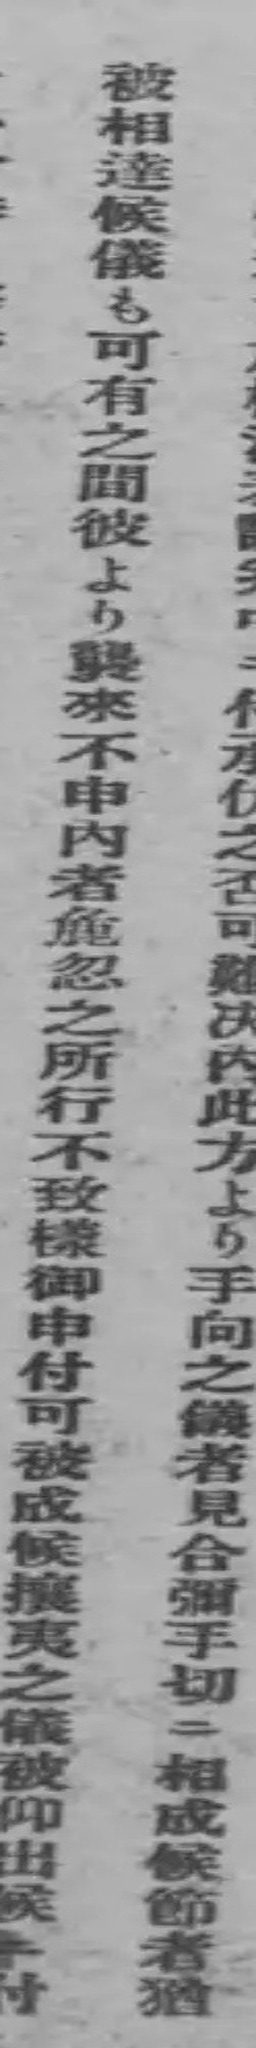被相達候儀も可有之間彼より襲来不申内者麁忽之所行不致様御申付可被成候攘夷之儀被仰出候ニ付
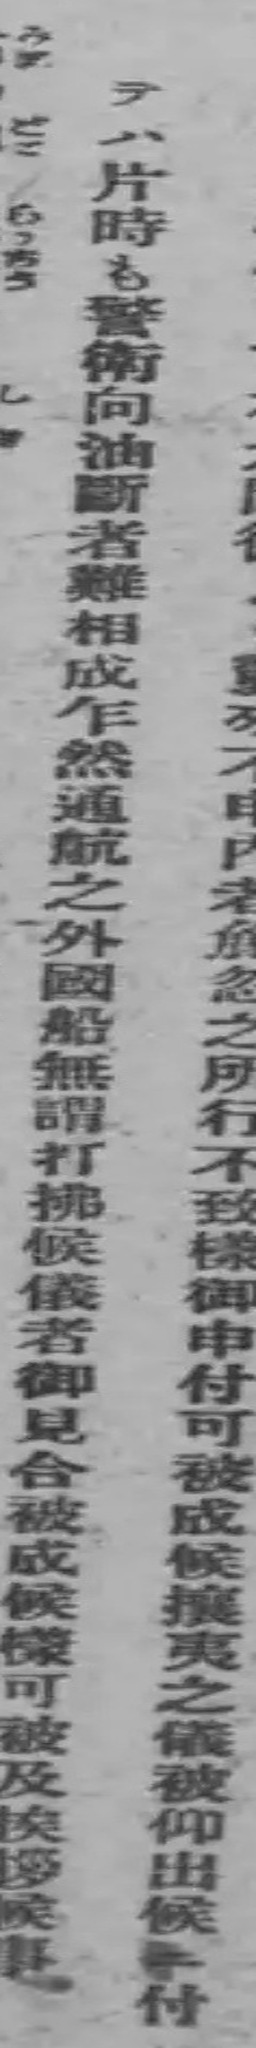テハ片時も警衛向油断者難相成乍然通航之外国船無謂打払候儀者御見合被成候様可被及挨拶候事
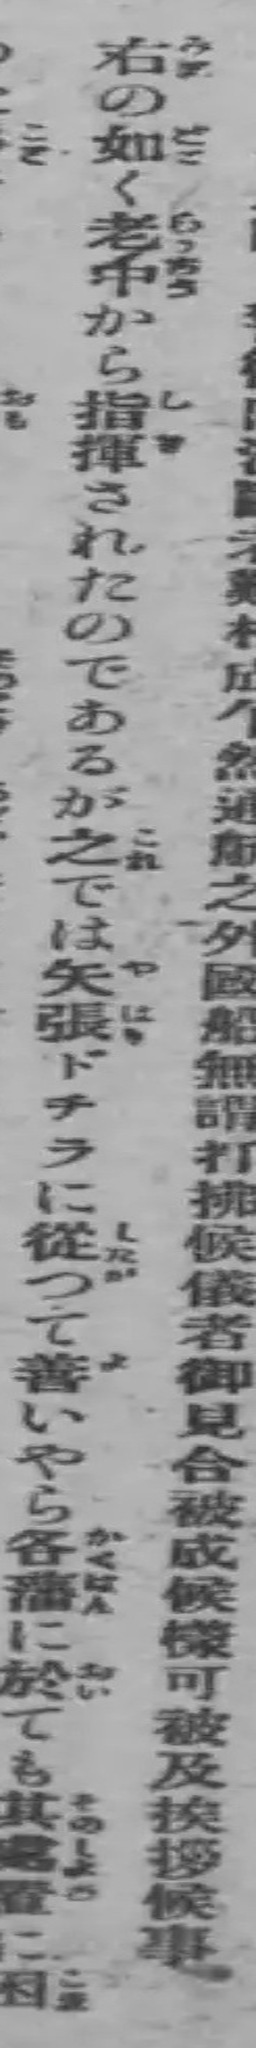右の如く老中から指揮されたのであるが之では矢張ドチラに従つて善いやら各藩に於ても其処置に困
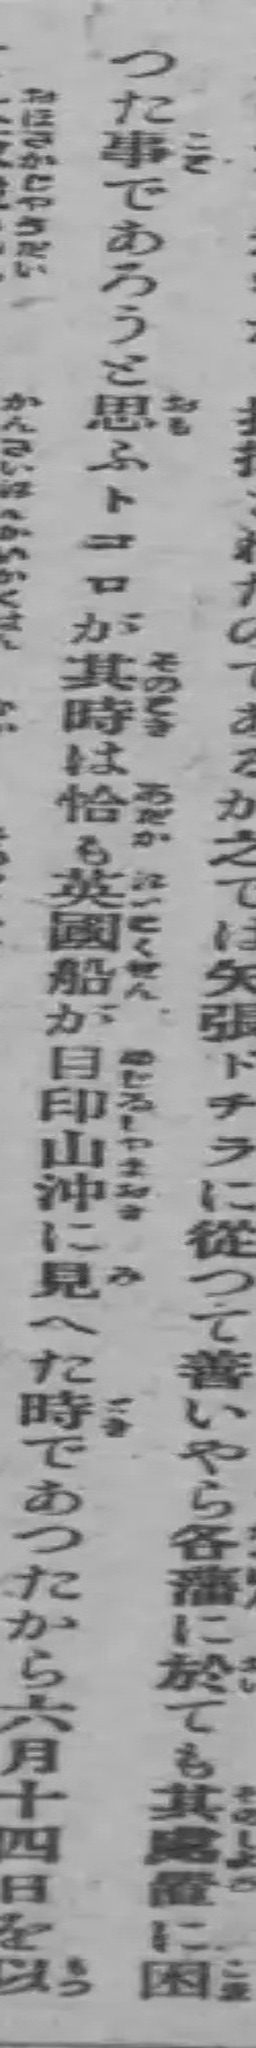つた事であろうと思ふトコロが其時は恰も英国詮が目印山沖に見へた時であつたから六月十四日を以
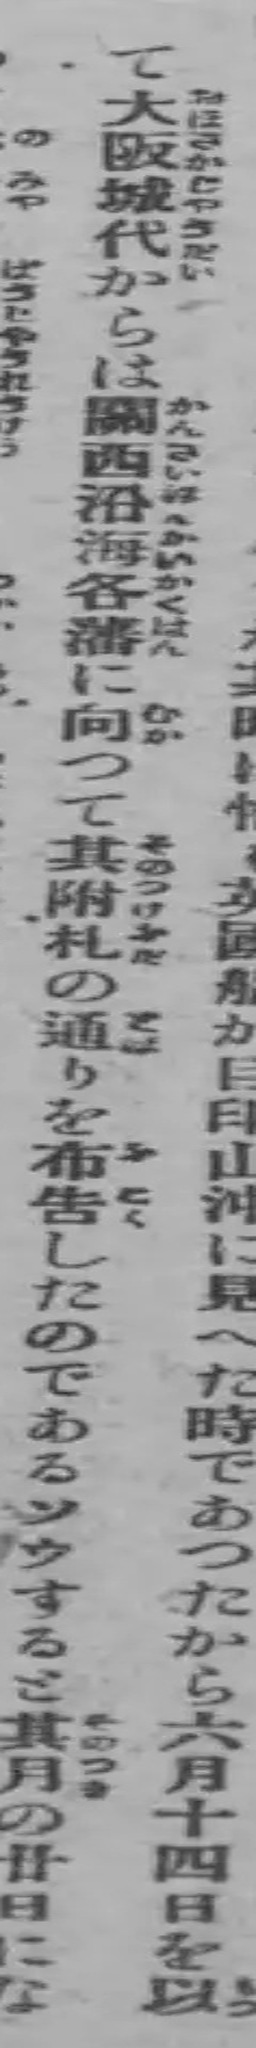て大阪城代からは関西沿海各藩に向つて其附札の通りを布告したのであるソウすると其月の廿日にな
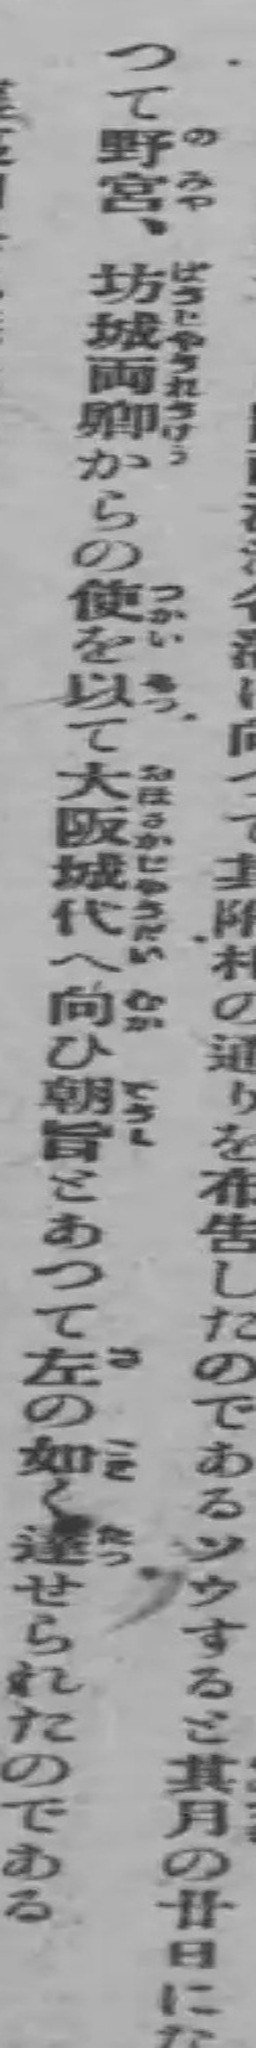つて野宮、坊城両卿からの使を以て大阪城代へ向ひ朝旨とあつて左の如く達せられたのである
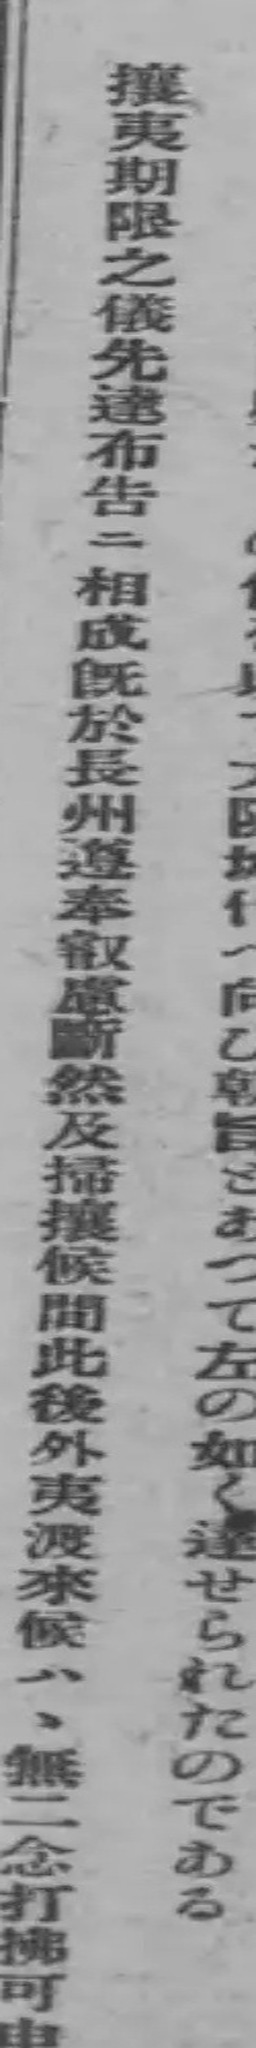攘夷期限之儀先達布告ニ相成既於長州遵奉叡慮断然及掃攘候間此後外夷渡来候ハヽ無二念打払可申
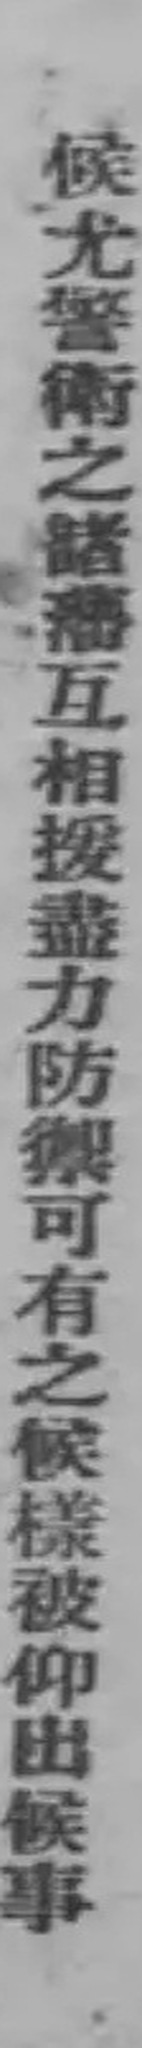候尤警衛之緒藩互相援尽力防禦可有之候様被仰出候事
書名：豊橋市史談
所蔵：国立国会図書館 National Diet Library, JAPAN
